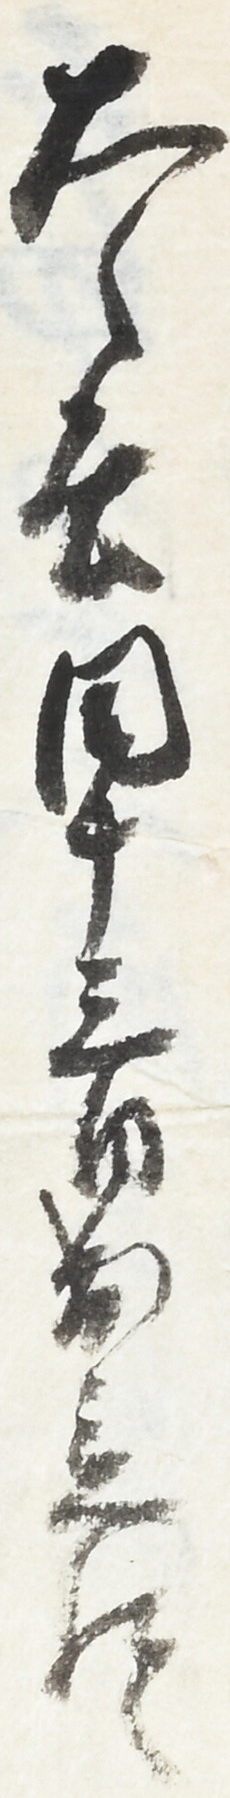右之者同十三日出立仕候

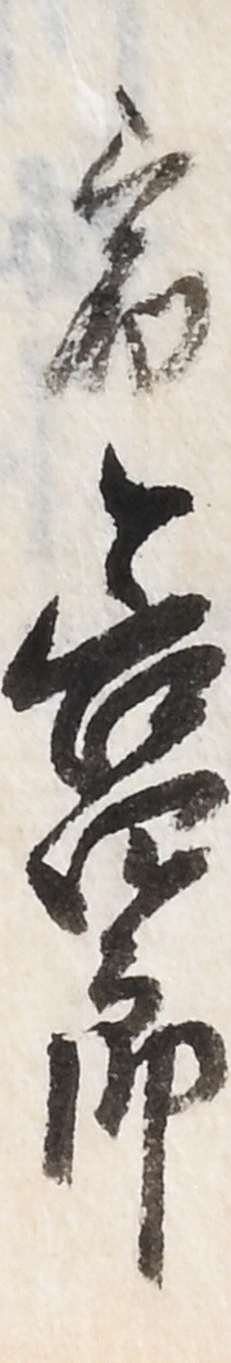宿善四郎
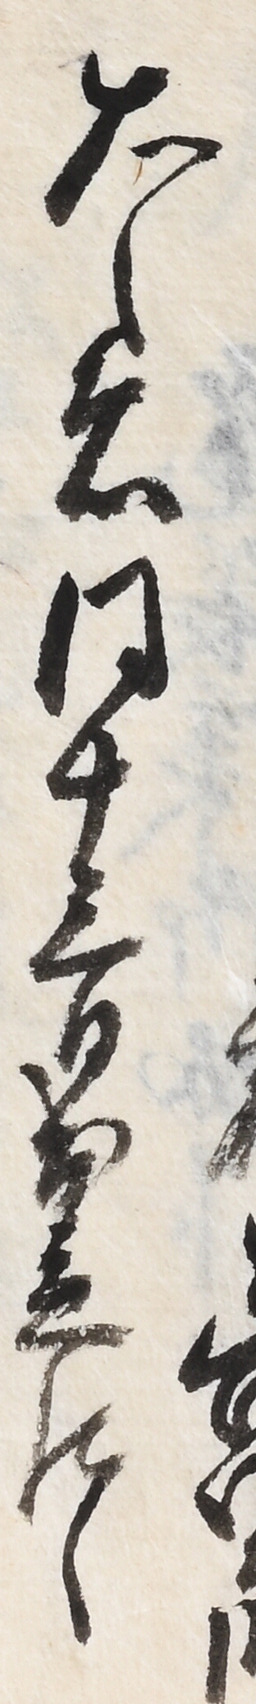右之者同十三日出立仕候
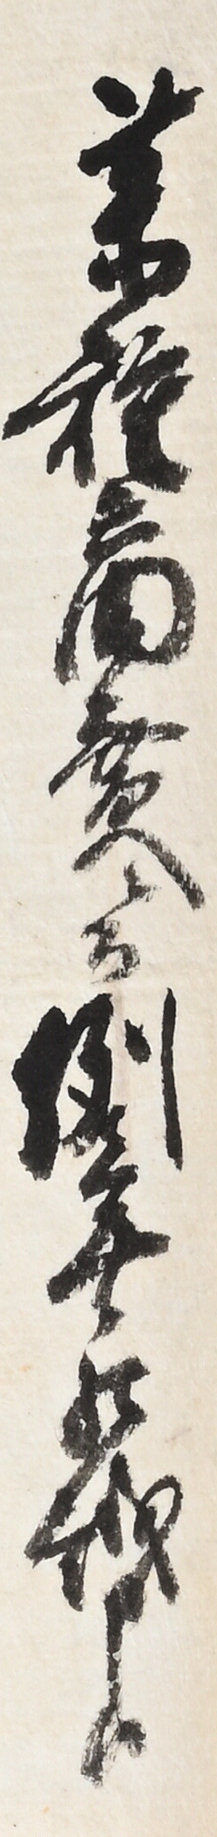薬種商売ニ而例年罷越申候
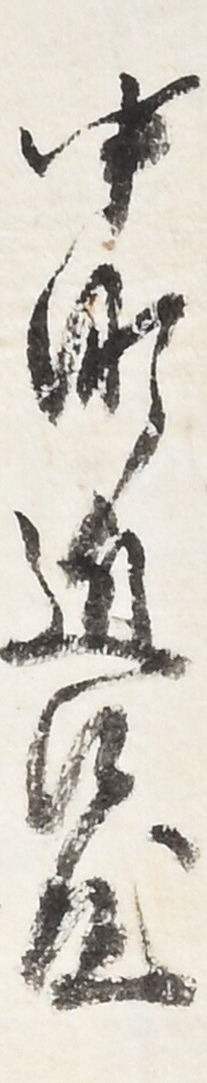中町近江屋
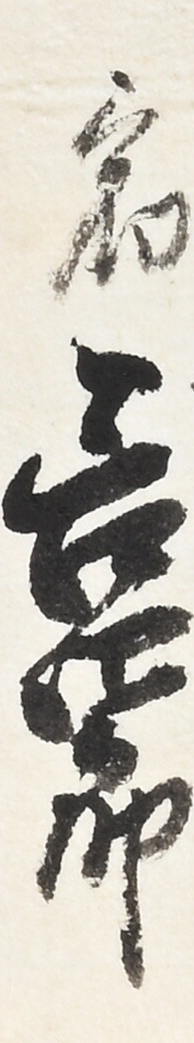宿善四郎
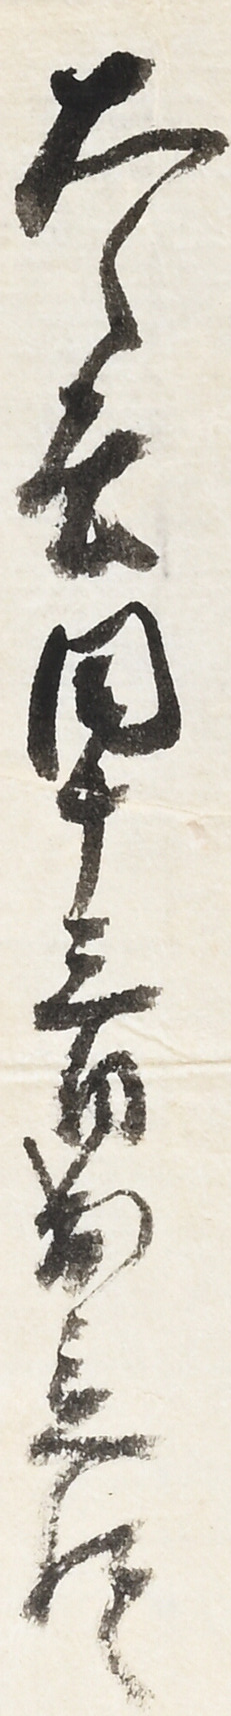右之者同十三日出立仕候
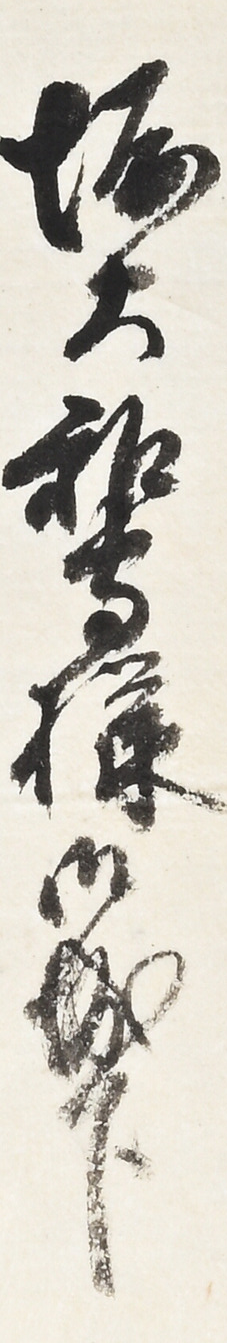堀大和守様御城下
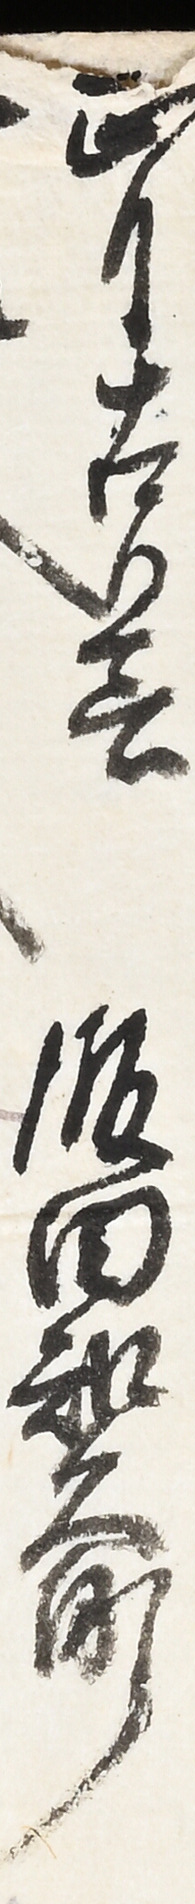正月十四日着飯田知久町
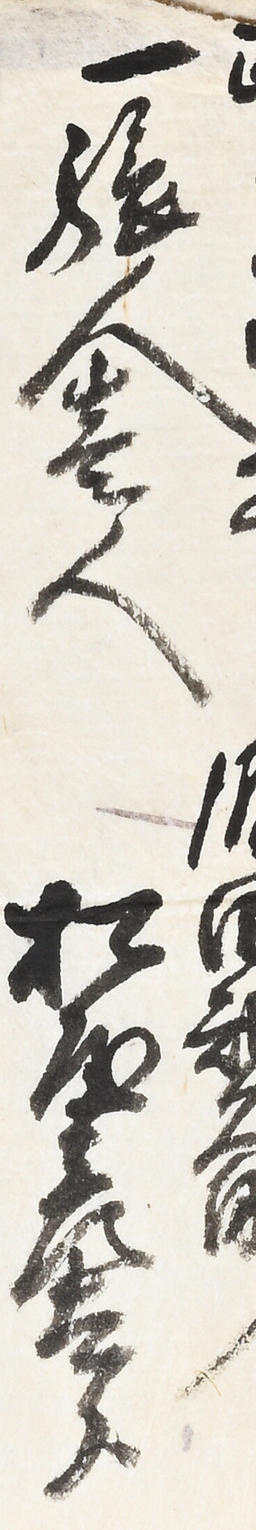一旅人壱人松屋彦太郎
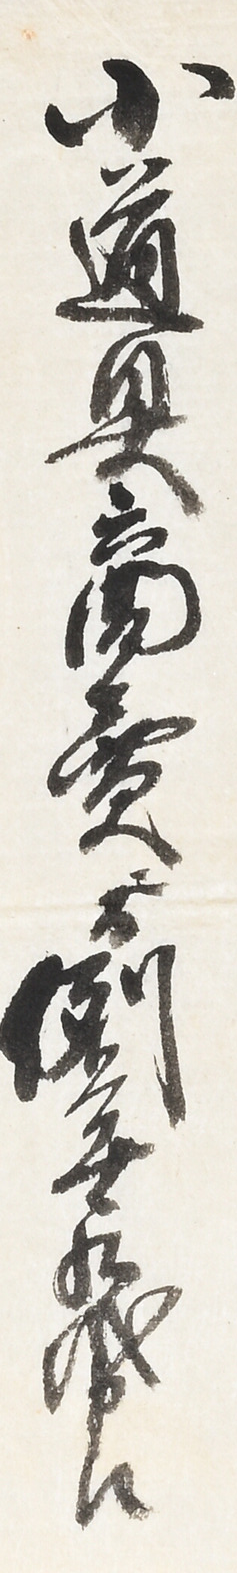小道具商売ニ而例年罷越申候
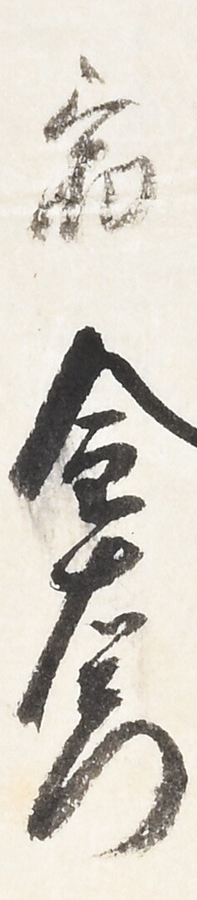宿金右衛門
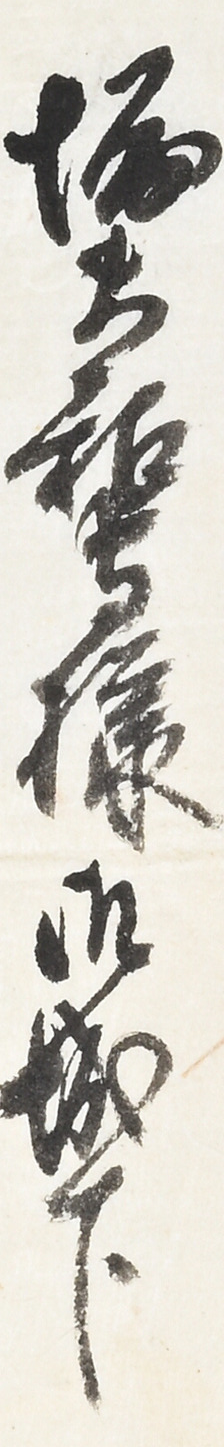堀大和守様御城下
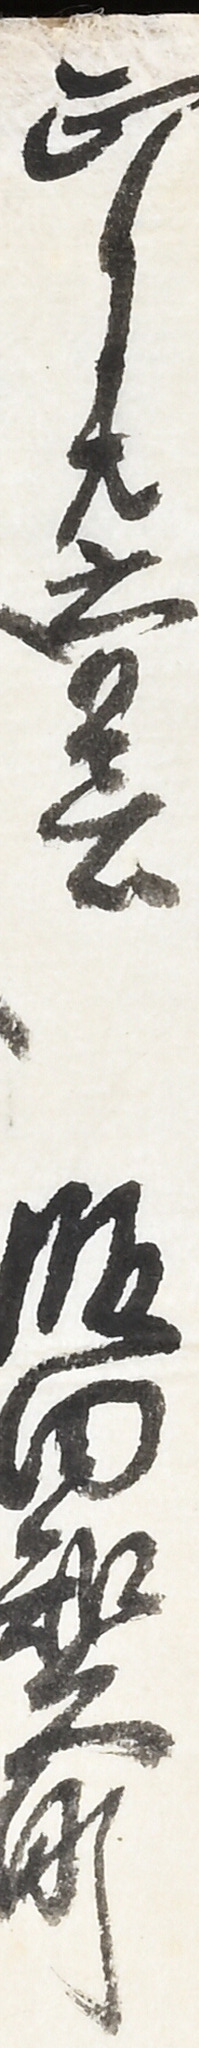正月廿六日着飯田知久町
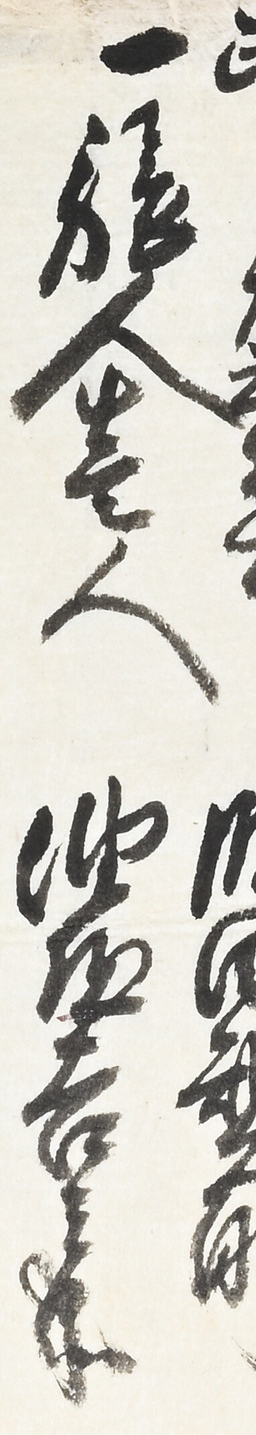一旅人壱人油屋吉兵衛
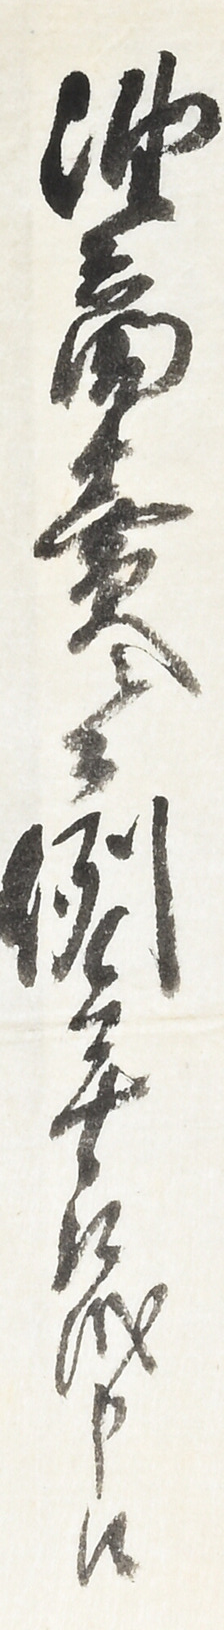油商売ニ而例年罷越申候
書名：旅人泊控帳
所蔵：伊那市立高遠町図書館・合同会社AMANE
